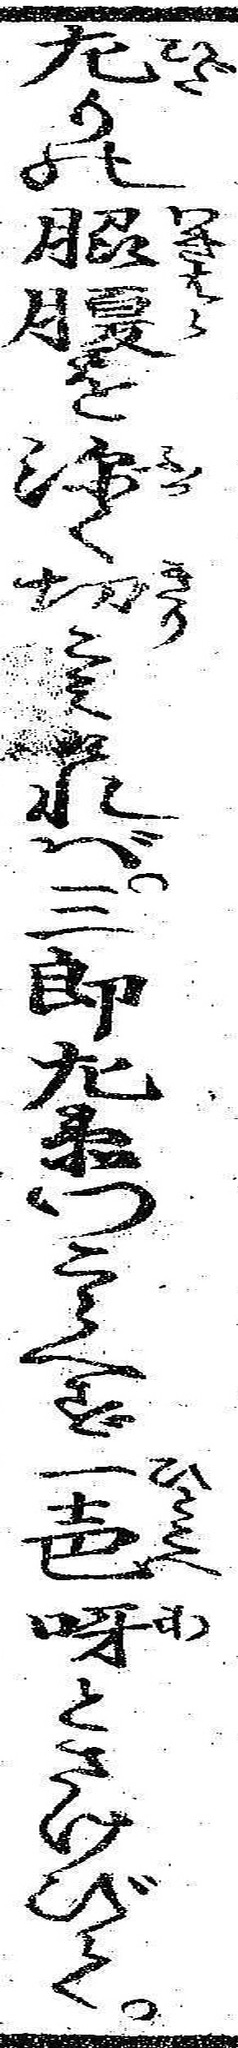左りの脇腹を深く切こみければ。三郎左衛門こらへず一声呀とさけびて。
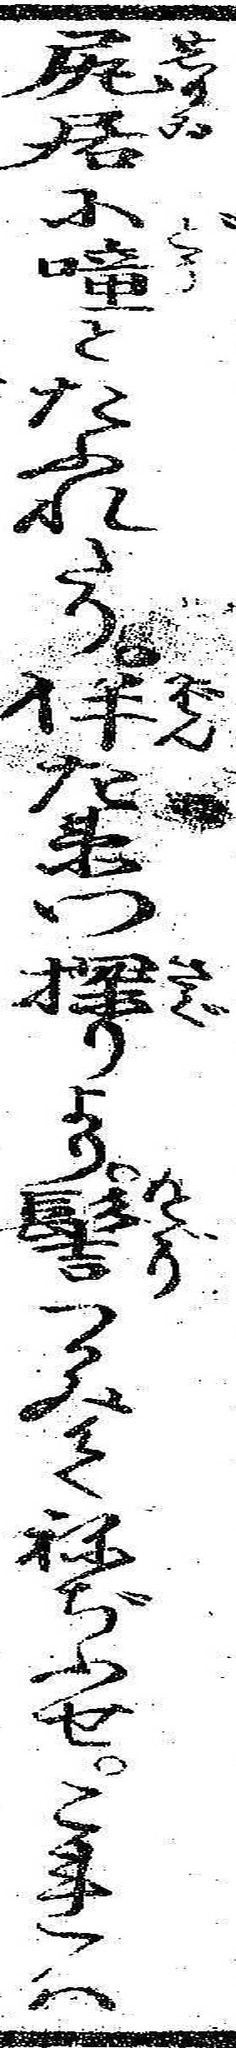尻居に噇たふれたり。伴左衛門探りより。髻つかみてねぢふせ。これは
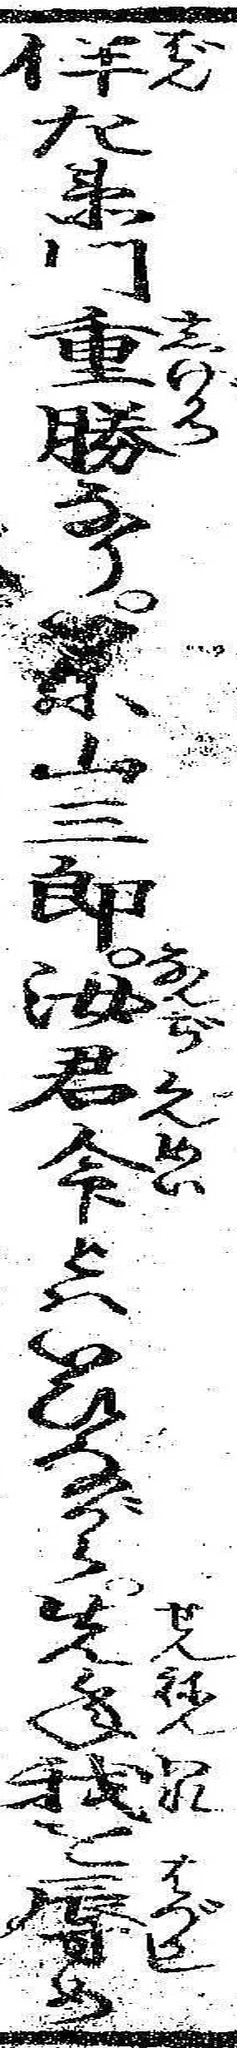伴左衛門重勝なり。いかに山三郎。汝君命とはいひながら。先年我を辱め
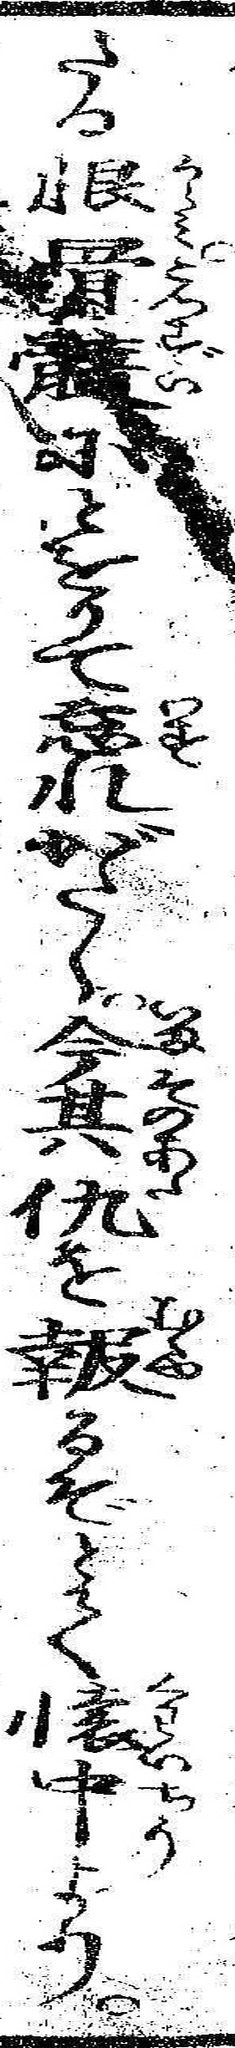たる恨。骨髄にとをりて忘れがたし。今其仇を報るぞとて懐中より。

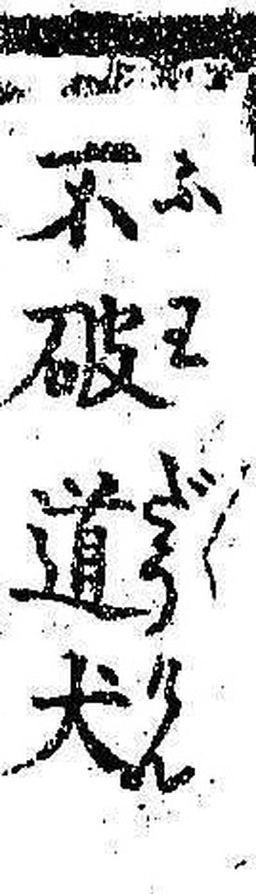不破道犬
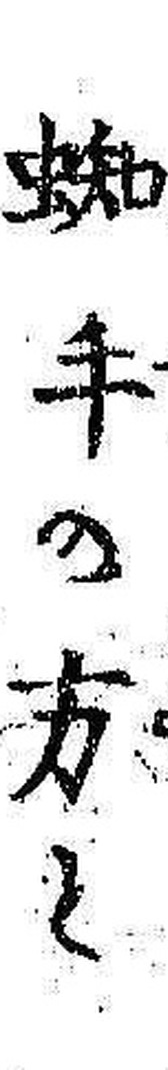蜘手の方と
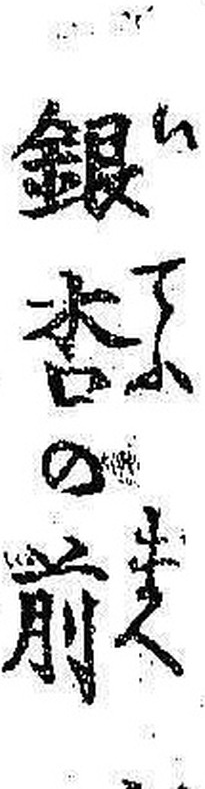銀杏の前
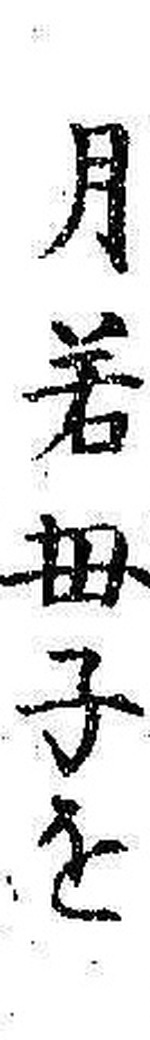月若母子を
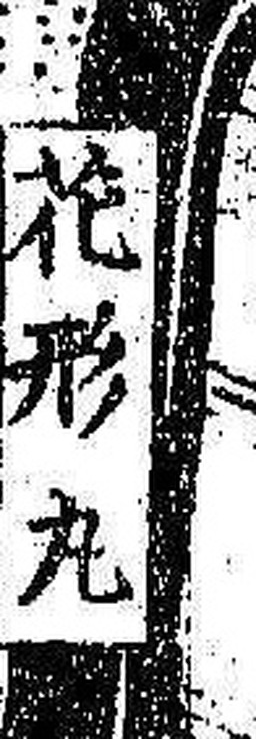花形丸
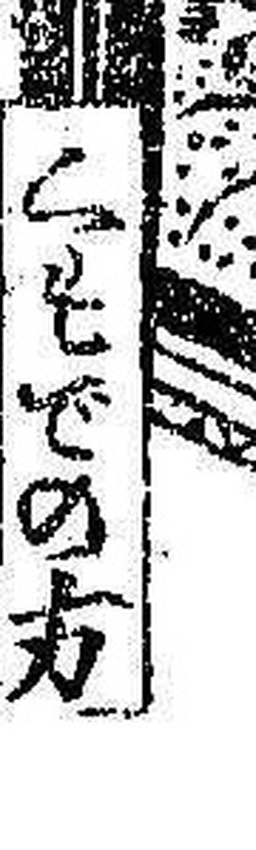くもでの方
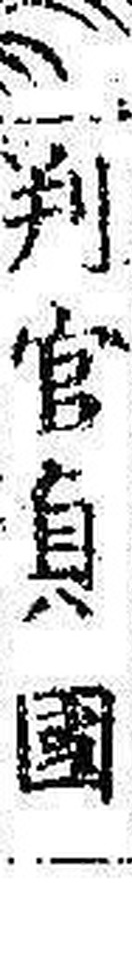判官貞国

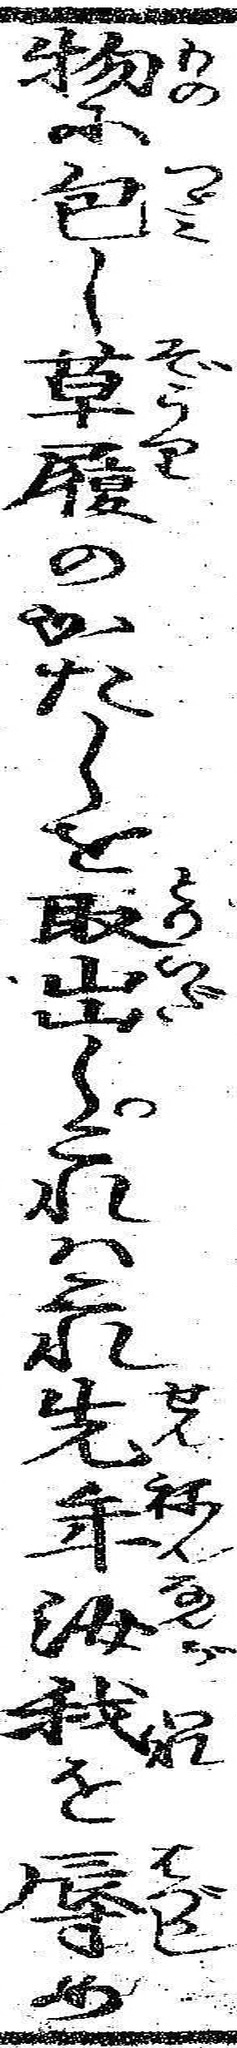物に包し草履のかたしを取出し。これはこれ先年汝我を辱め
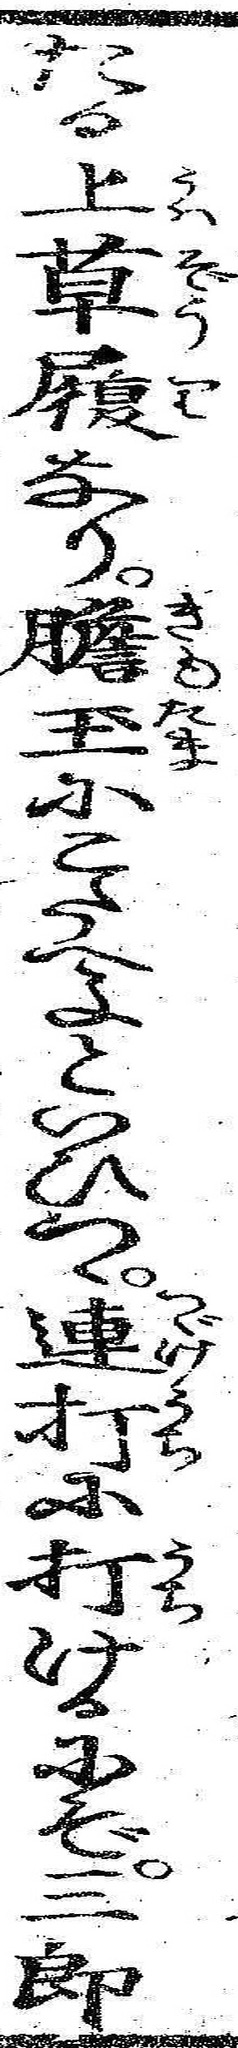たる上草履なり。胆玉にこたへよといひつゝ。連打に打けるにぞ。三郎
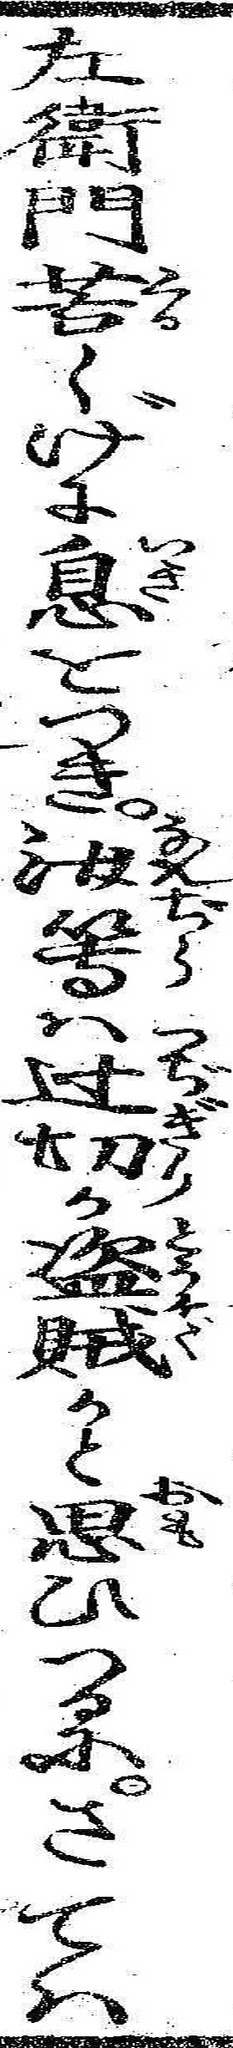左衛門苦しげに息をつき。汝等は辻切か盗賊かと思ひつるに。さては
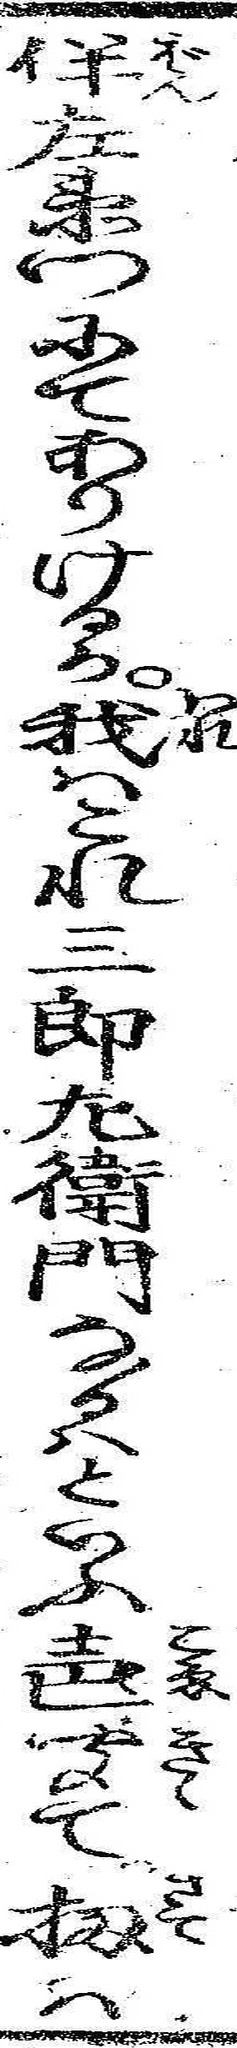伴左衛門にてありけるか。我はこれ三郎左衛門なるはといふ声聞て。扨は
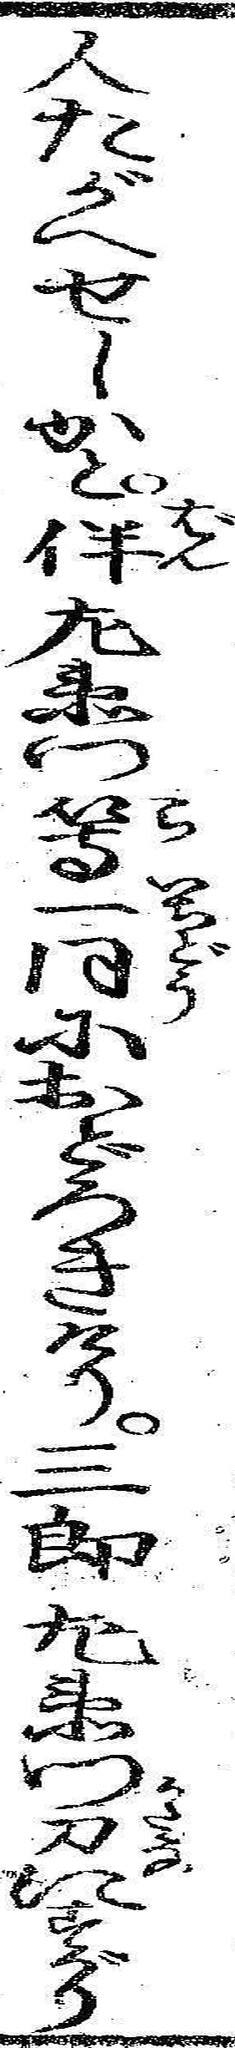人たがへせしかと。伴左衛門等一同におどろきけり。三郎左衛門刀にすがり
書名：昔話稲妻表紙
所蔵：国文学研究資料館
